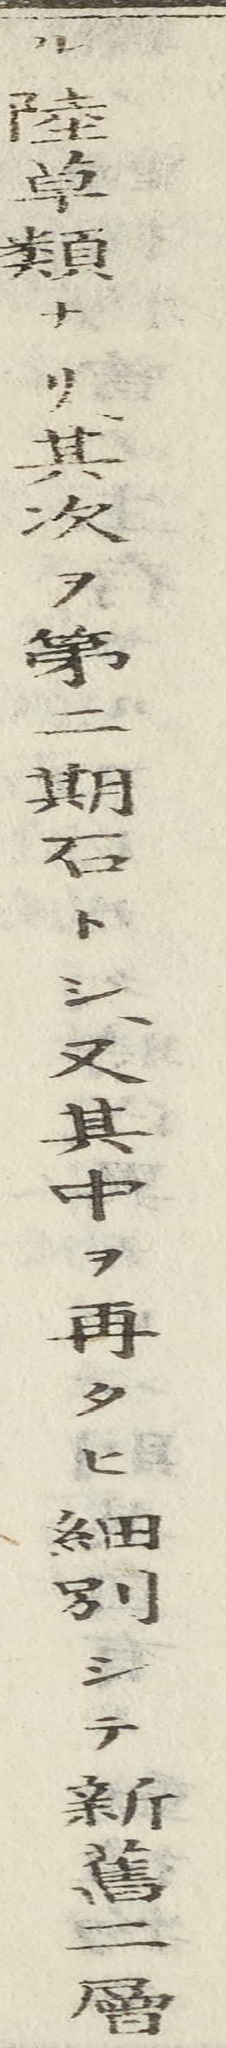ル陸草類ナリ、其次ヲ第二期石トシ、又其中ヲ再タヒ細別シテ新旧二層
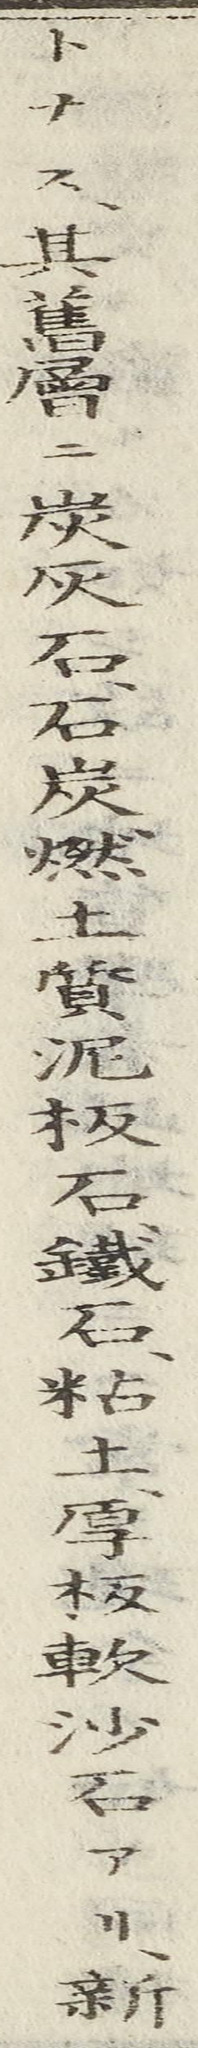トナス、其旧層ニ炭灰石、石炭、燃土質泥板石、鉄石、粘土、厚板軟沙石アリ、新
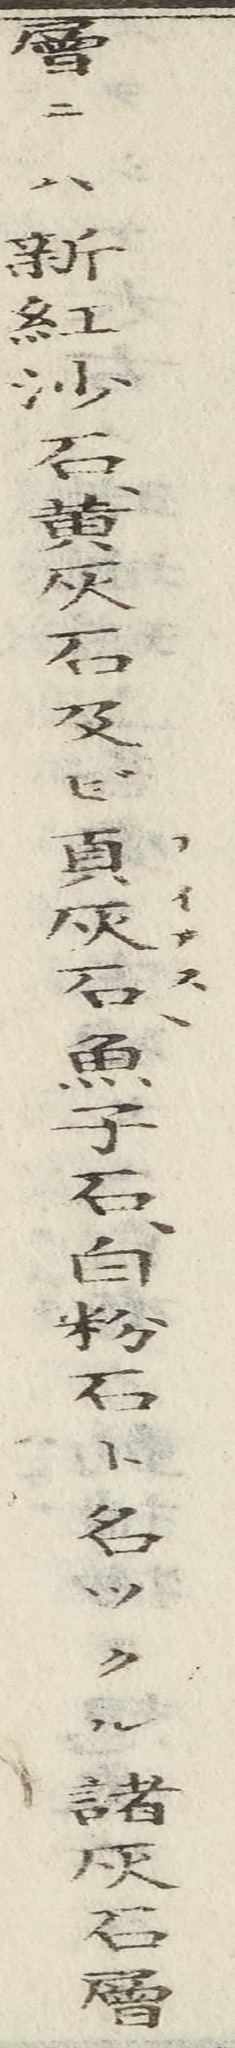層ニハ新紅沙石、黄灰石及ビ頁灰石、魚子石、白粉石ト名ツクル諸灰石層
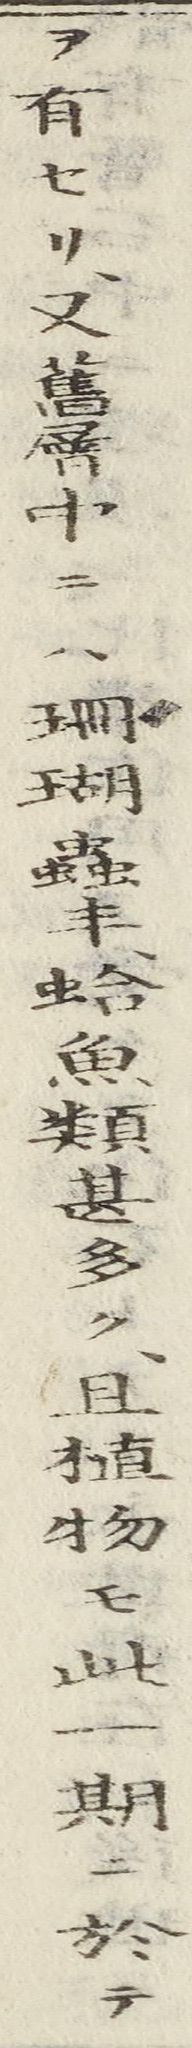ヲ有セリ、又旧層中ニハ珊瑚虫丰、蛤魚類甚多ク、且植物モ此一期ニ於テ
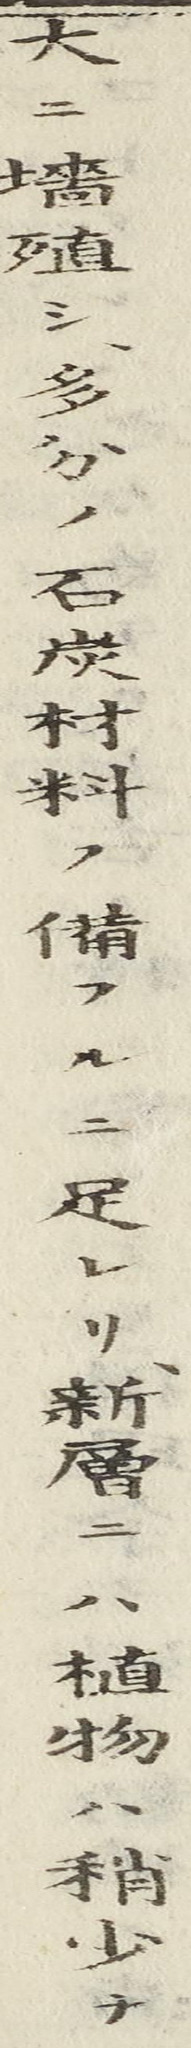大ニ墻殖シ、多分ノ石炭材料ノ備フルニ足レリ、新層ニハ植物ハ稍少ナ
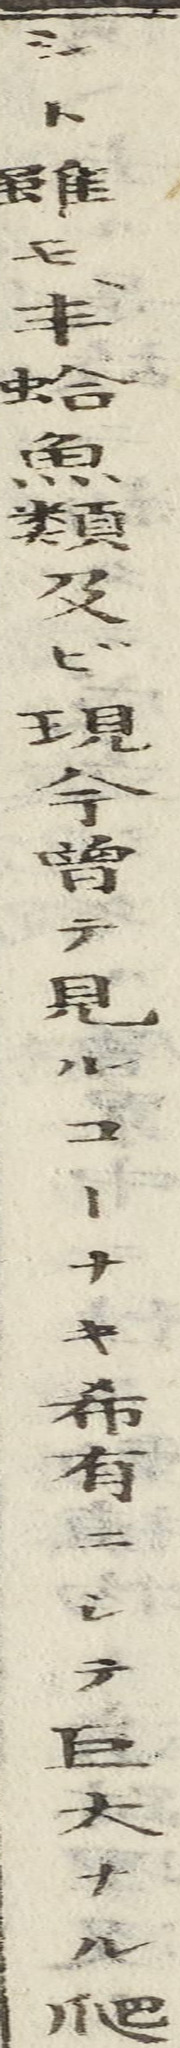シト雖モ、丰蛤魚類及ビ現今曾テ見リコトナキ希有ニシテ巨大ナル爬
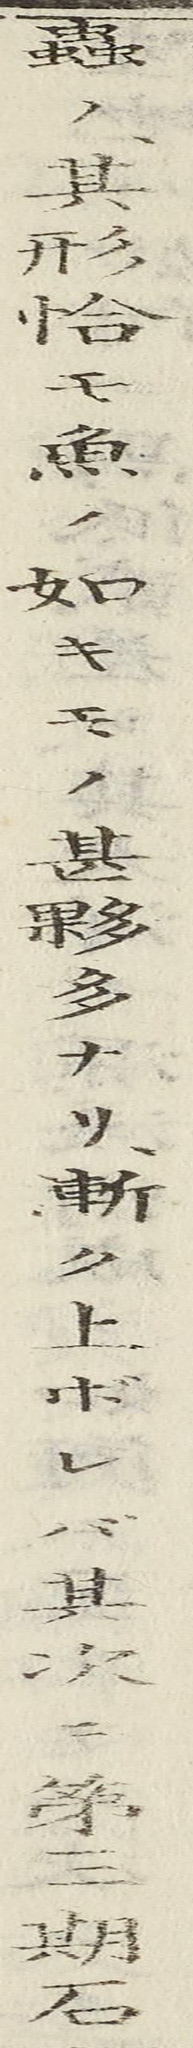虫ノ、其形恰モ魚ノ如キモノ甚夥多ナリ、漸ク上ボレバ其次ニ第三期石
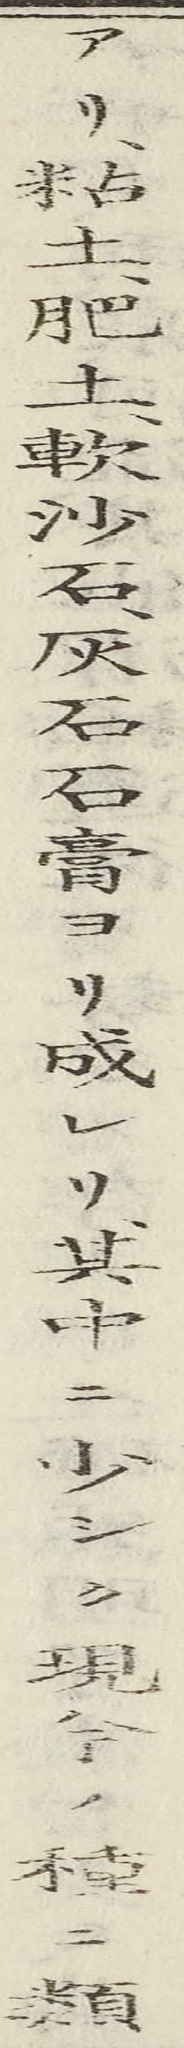アリ、粘土、肥土、軟沙石、灰石石膏ヨリ成レリ、其中ニ少シク現今ノ種ニ類
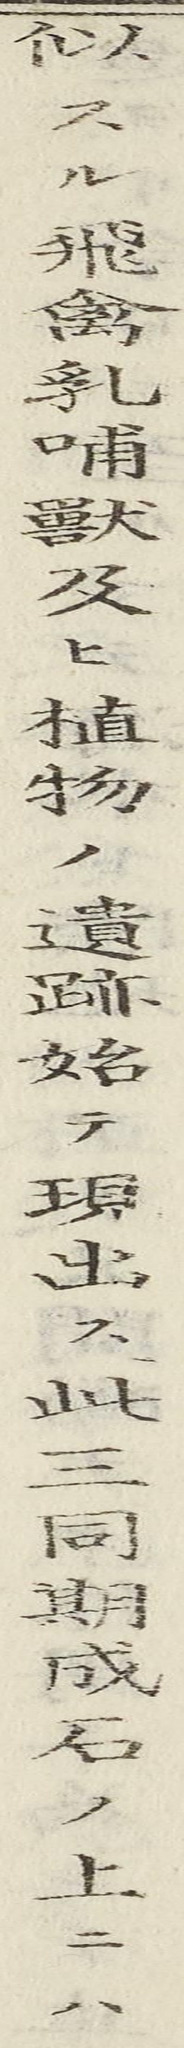似スル飛禽乳哺獣及ヒ植物ノ遺跡始テ現出ス此三同期成石ノ上ニハ
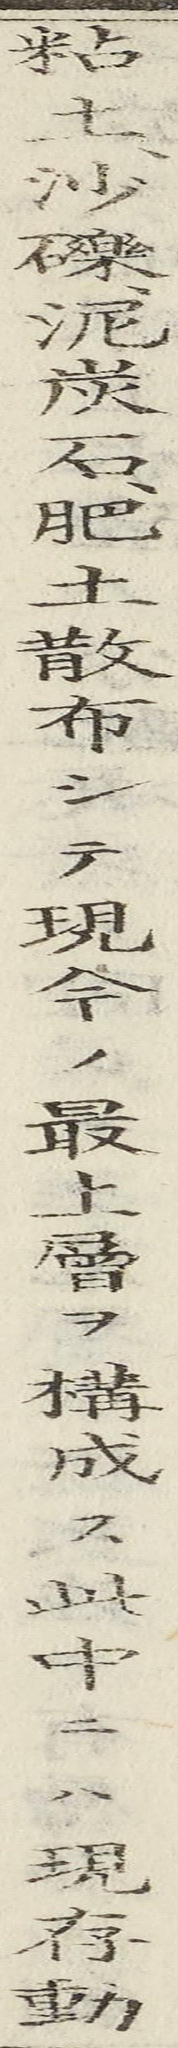粘土、砂礫、泥炭石、肥土散布シテ現今ノ最上層ヲ構成ス此中ニハ現存動
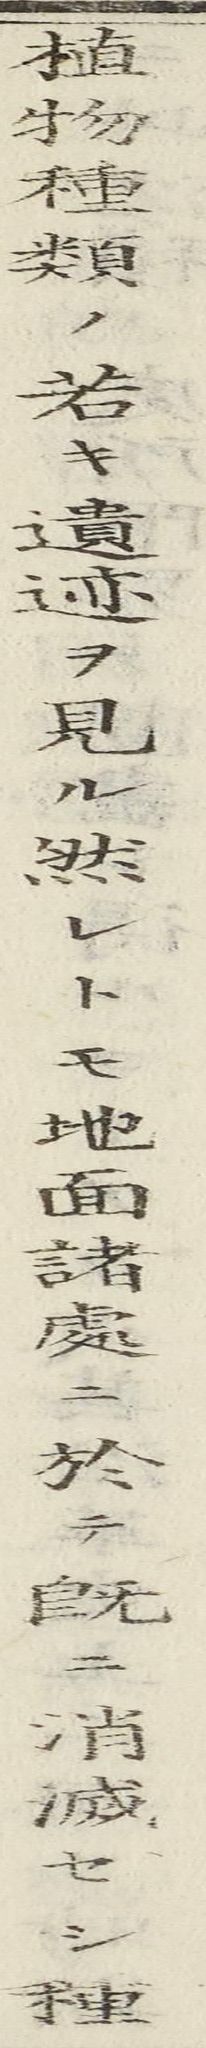植物種類ノ若キ遺迹ヲ見ル然レトモ地面諸処ニ於テ既ニ消滅セシ種
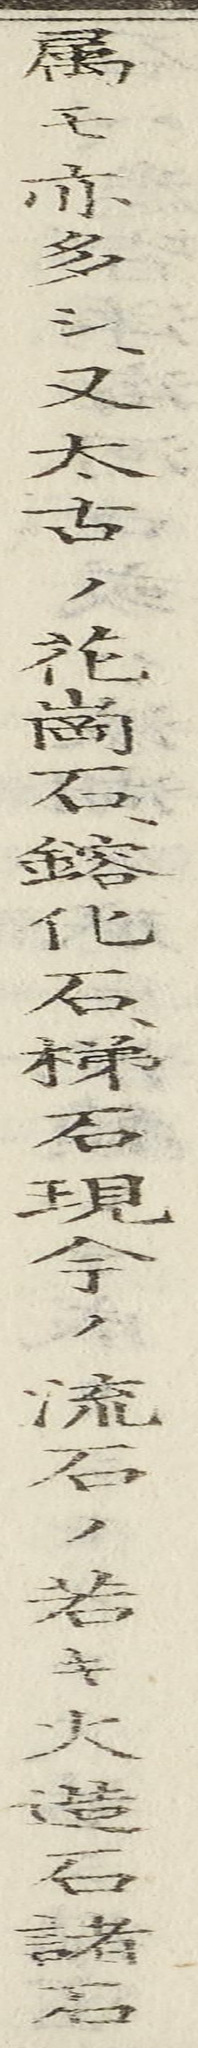属モ亦多シ、又太古ノ花崗石、溶化石、梯石現今ノ流石ノ若キ火造石諸石
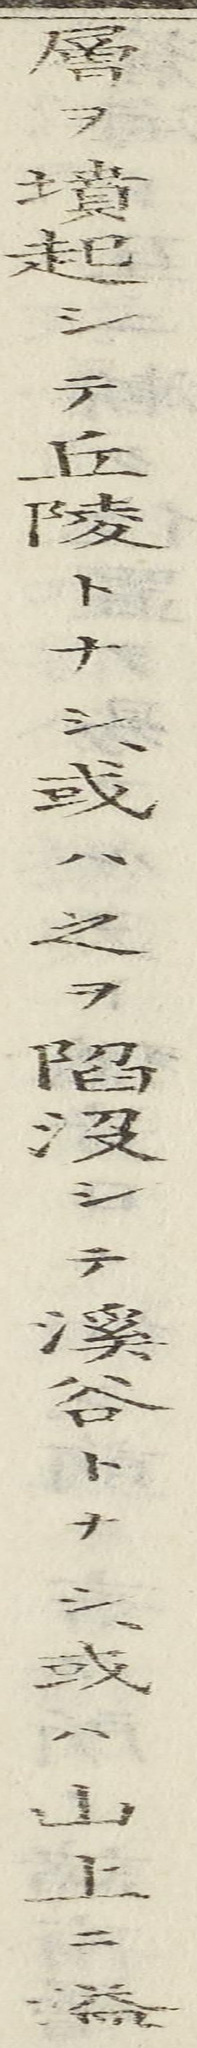層ヲ墳起シテ丘陵トナシ、或ハ之ヲ陥没シテ渓谷トナシ、或ハ山上ニ溢
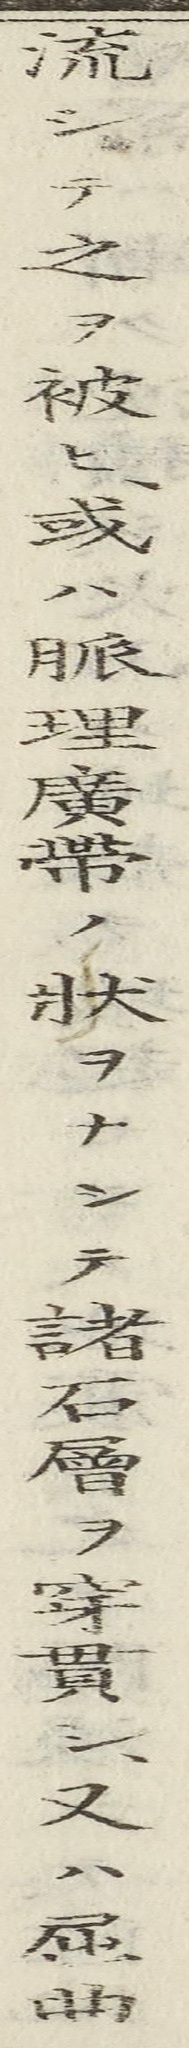流シテ之ヲ被ヒ、或ハ脈理広帯ノ状ヲナシテ諸石層ヲ穿貫シ、又ハ屈曲
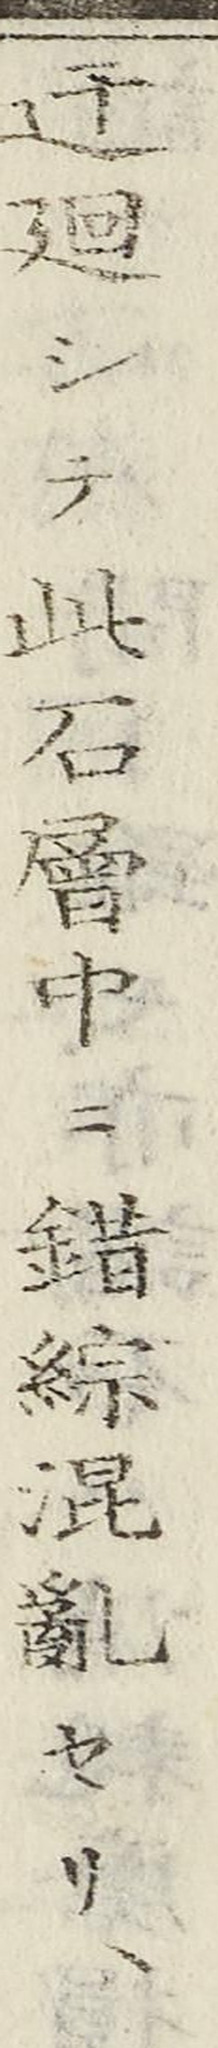迂廻シテ此石層中ニ錯綜混乱セリ、
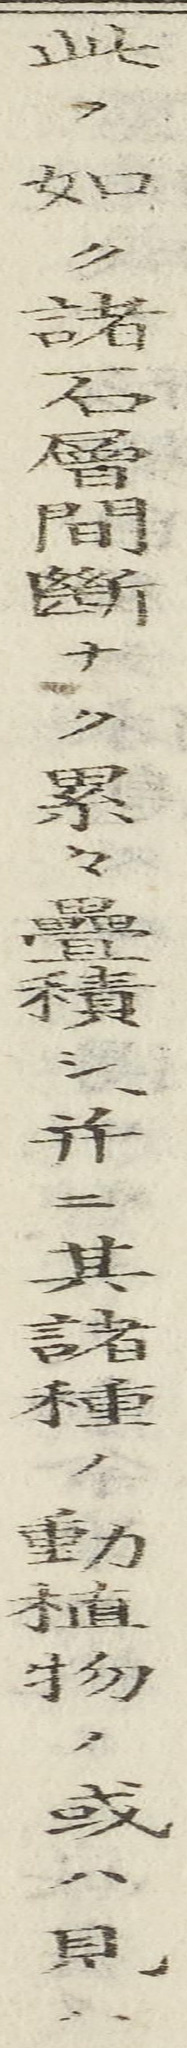此ノ如ク諸石層間断ナク累々畳積シ、幷ニ其諸種ノ動植物ノ或ハ見ス
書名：百科全書　地文學　全
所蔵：東京大学地震研究所図書室 Earthquake Research Institute Library, The University of Tokyo, JAPAN
